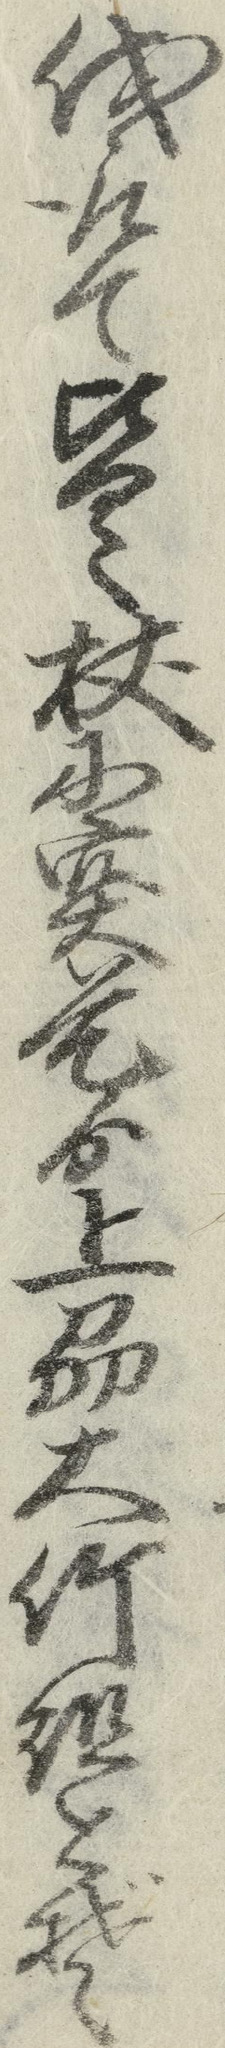伐取て皆々杖に突是ゟ上州大竹組とぞ
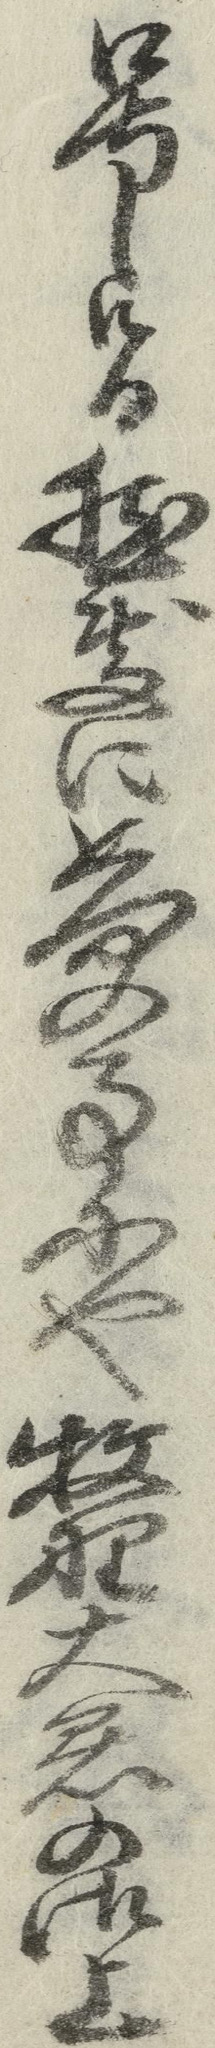号しける然処に如何の事にや牧野大君の御上
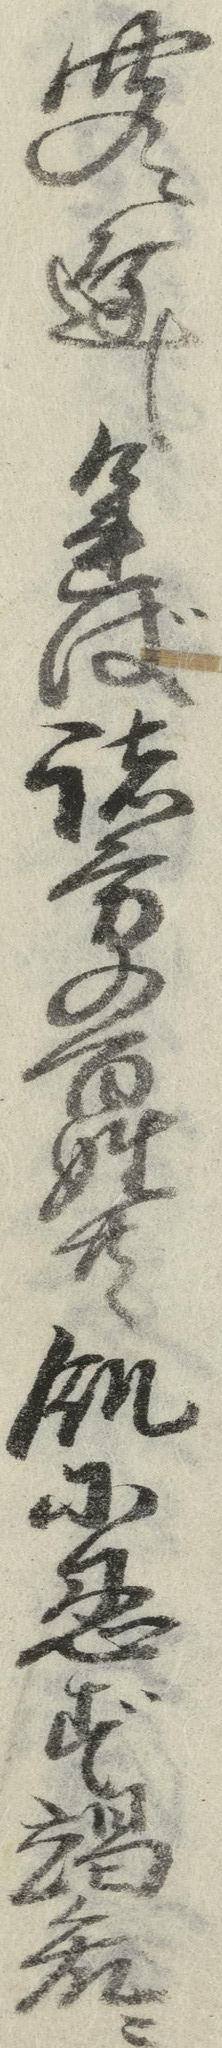聞に達しければ諸方の百姓共飢に忍ず竭故に
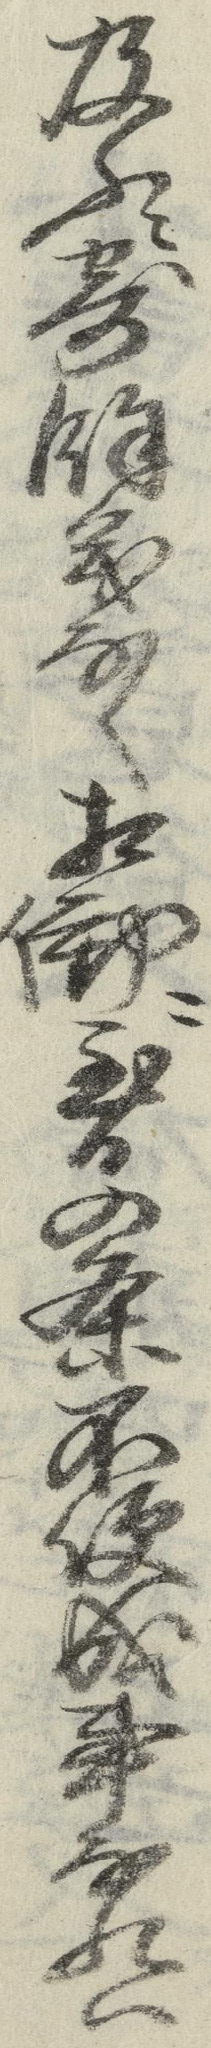及ふに寄餘義なく相働に至るの条不便成事なれは
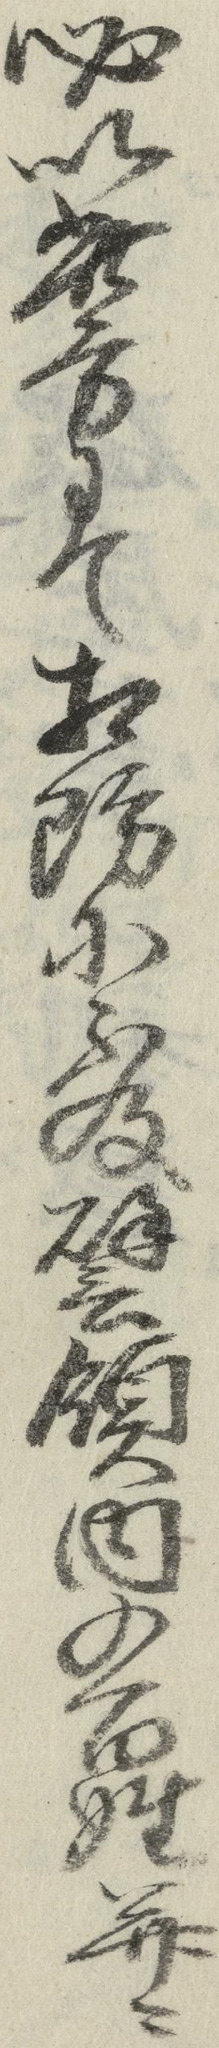必以此方にて相防に不及譬領内の百姓幷に
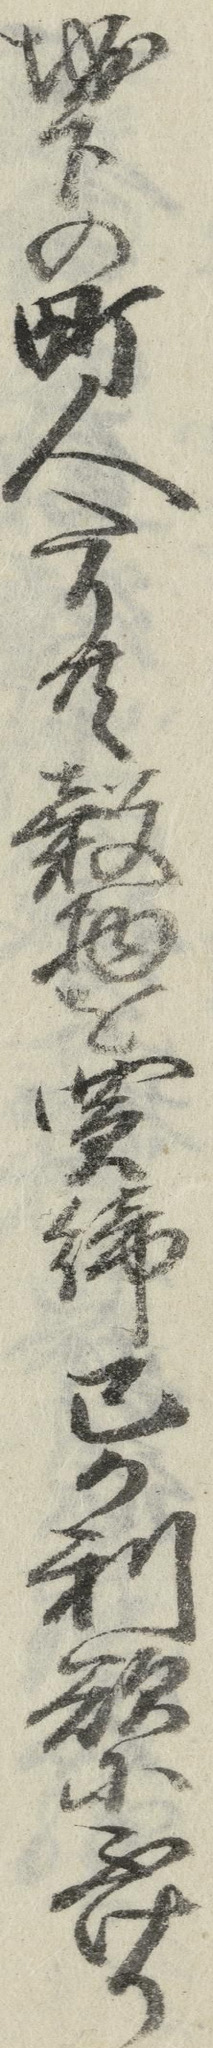城下の町人たり共穀物を買締己の利欲にふけり
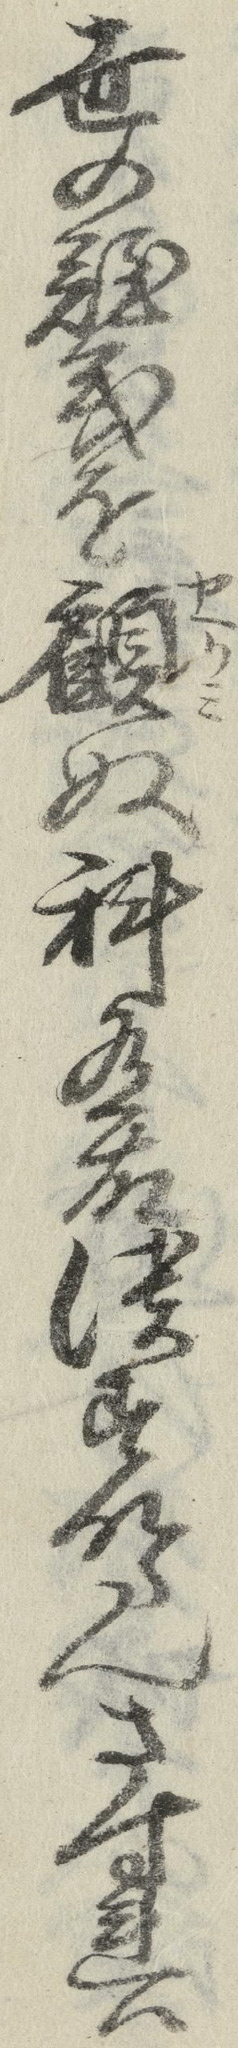世の難義を-顧ぬ科有故潰すならんさすれは
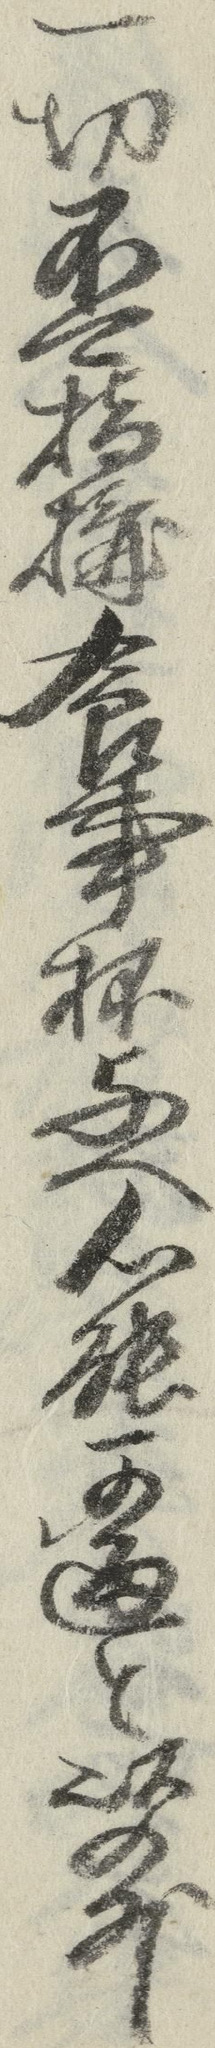一切不可指構食事抔与へ心能可通と以の外
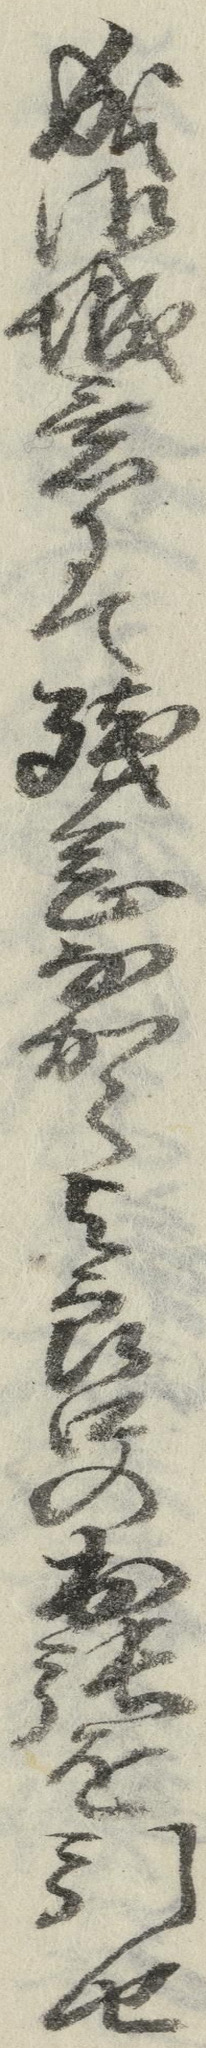成御城意にて残念なから与良口の出張を引セ
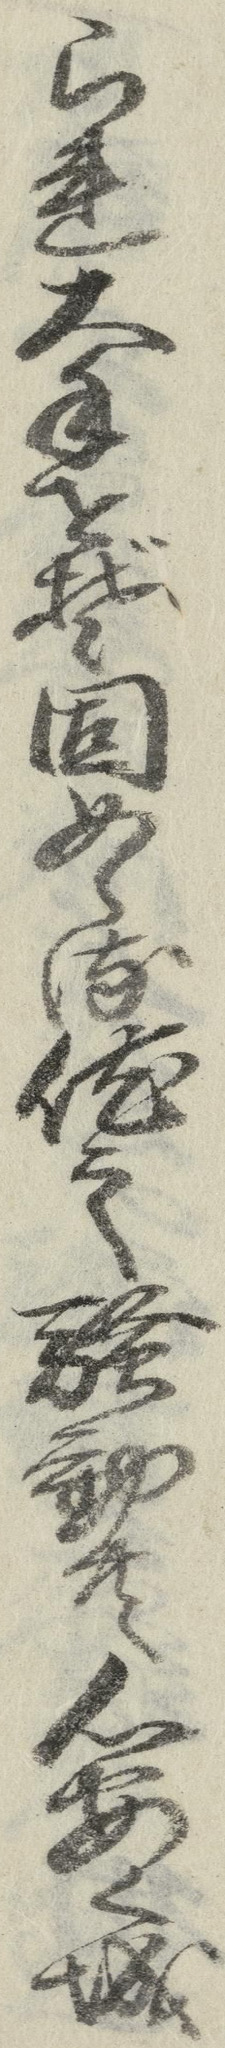られ大手をぞ固めらる依之騒動共心安く城
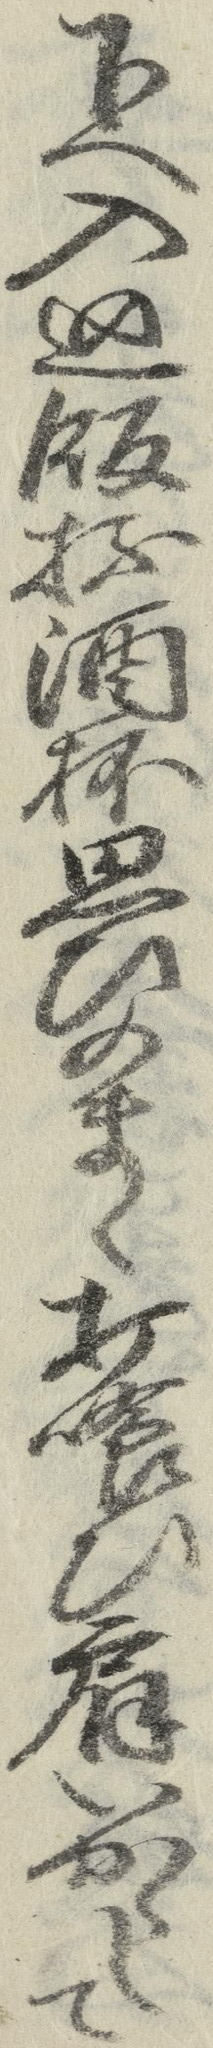下へ入込飯抔酒抔思ひのまゝ打喰ひ肩いからして

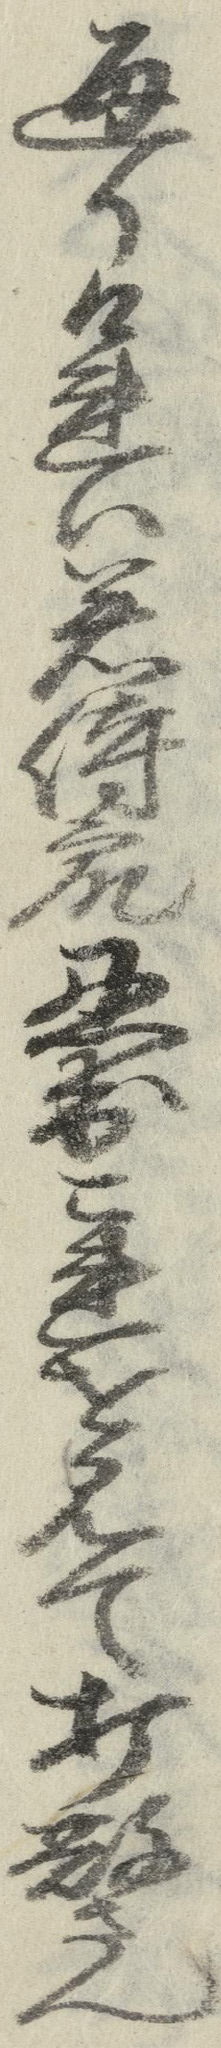通りけれは若侍衆忍出これを見て打散さん
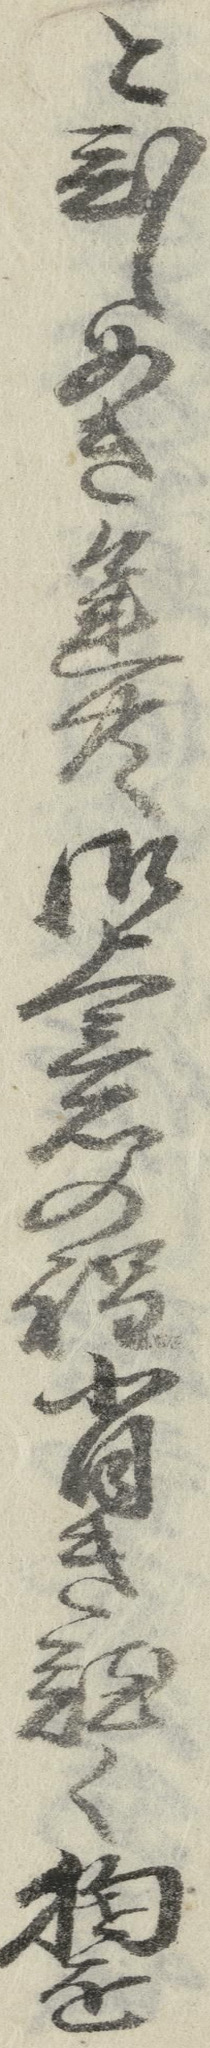とひしめきけれ共御上意の程背き難く胸を
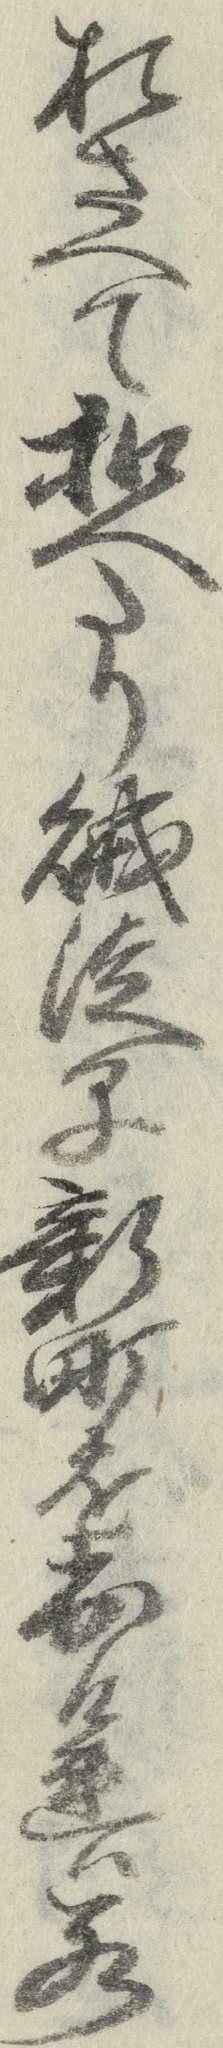おさへて扣へたり賊徒早新町を出けれは若
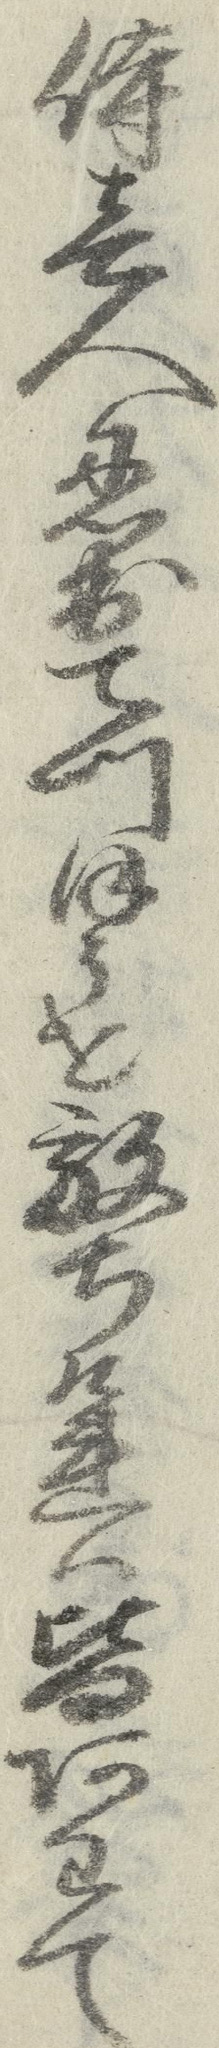侍壱人忍出てつほうを放ちけれは皆あわて
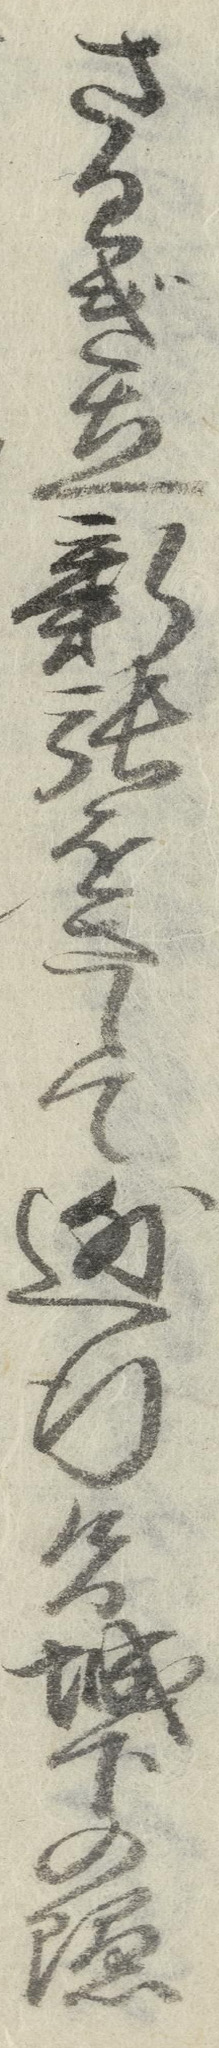さわぎ立新張をきして迯行ける城下の隠
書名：浅間大焼騒動記　下
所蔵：東京大学地震研究所図書室 Earthquake Research Institute Library, The University of Tokyo, JAPAN
